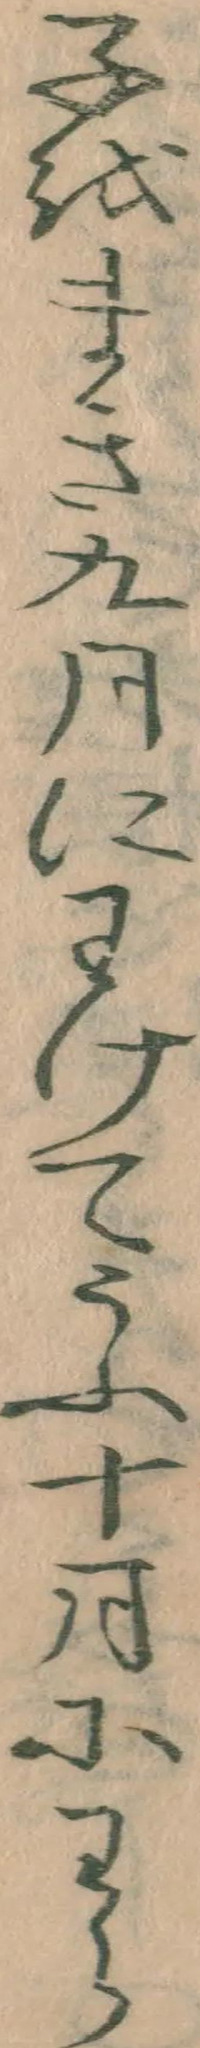子をまき九月にわけてうふ十月にわら
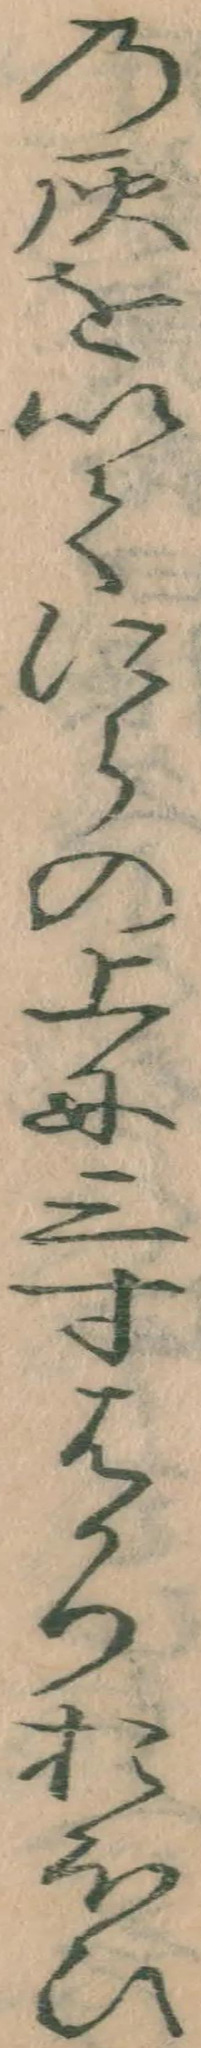の灰を以てにらの上に三寸はかりおほひ
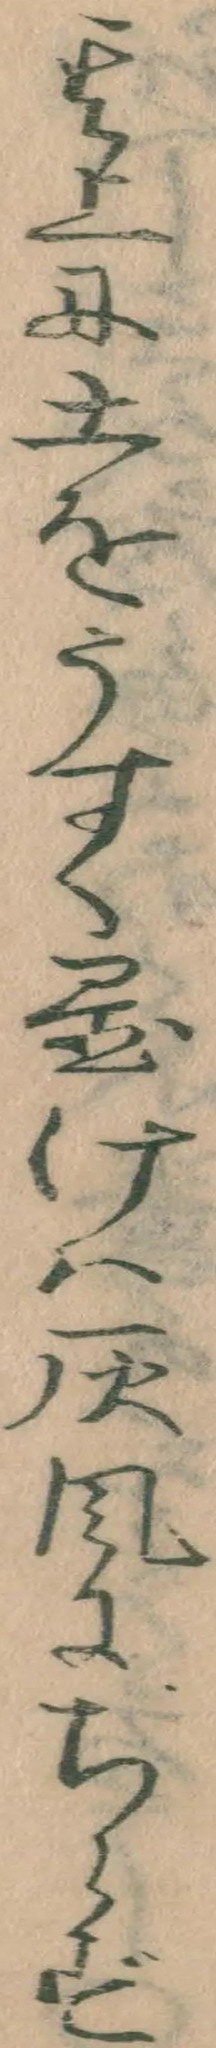其上に土をうすく置けは灰風にちらず
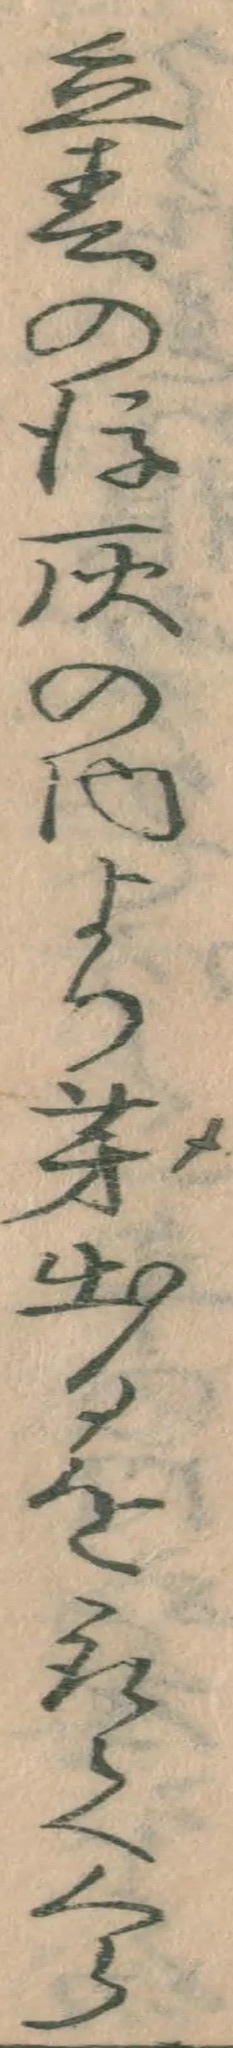立春の後灰の内より芽出るを取てくら
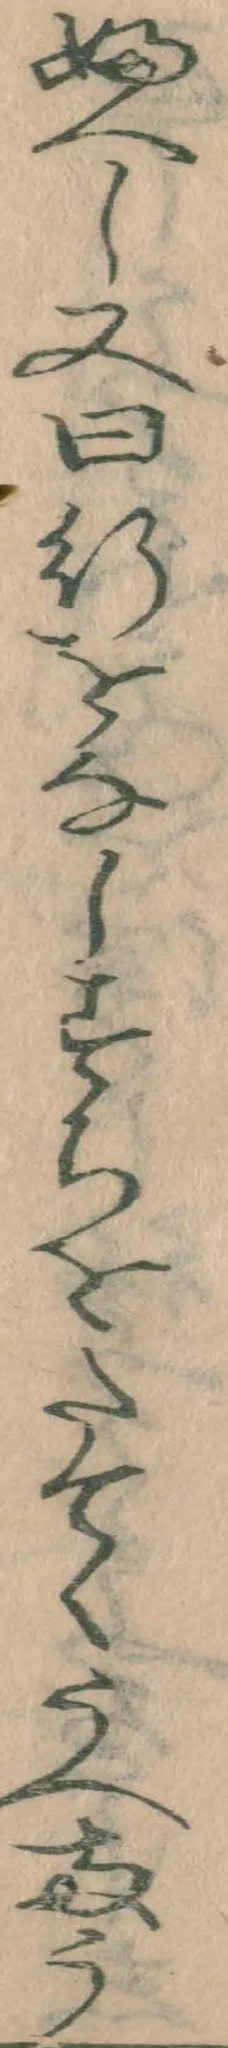ふへし又曰行をなしすちをたてゝうへ両う
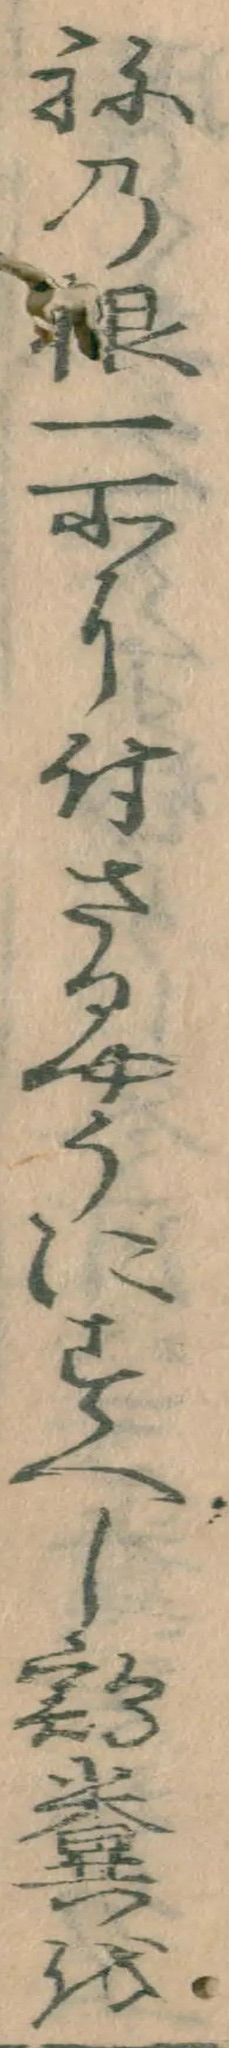ねの根一所に付さるやうにすへし鶏糞を

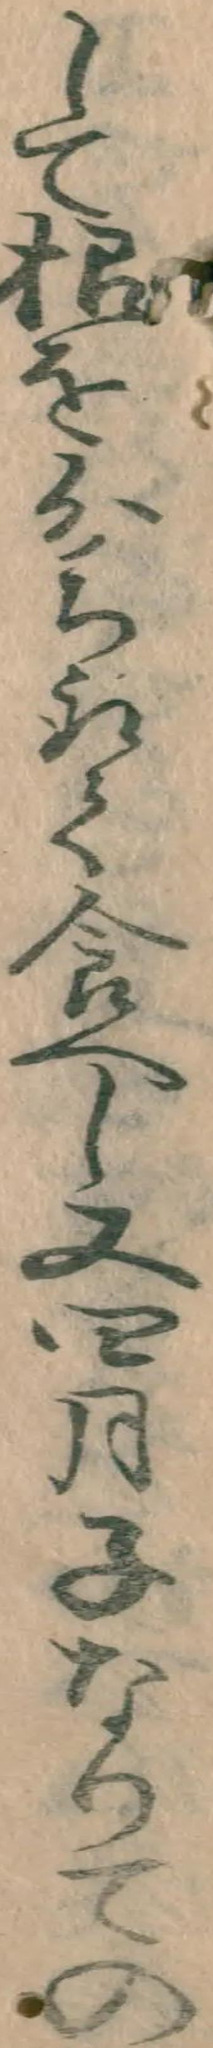して根を分ち取て食へし又四月子なりての
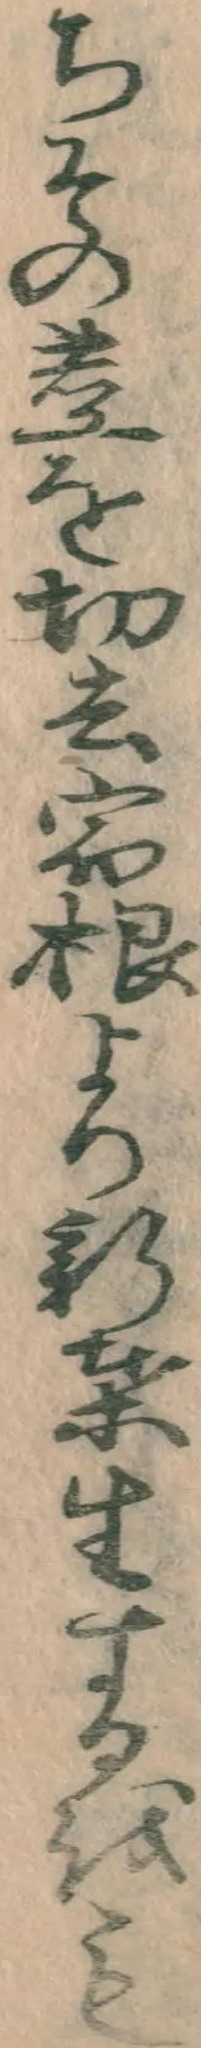ちその茎を切去宿根より新葉生するをも
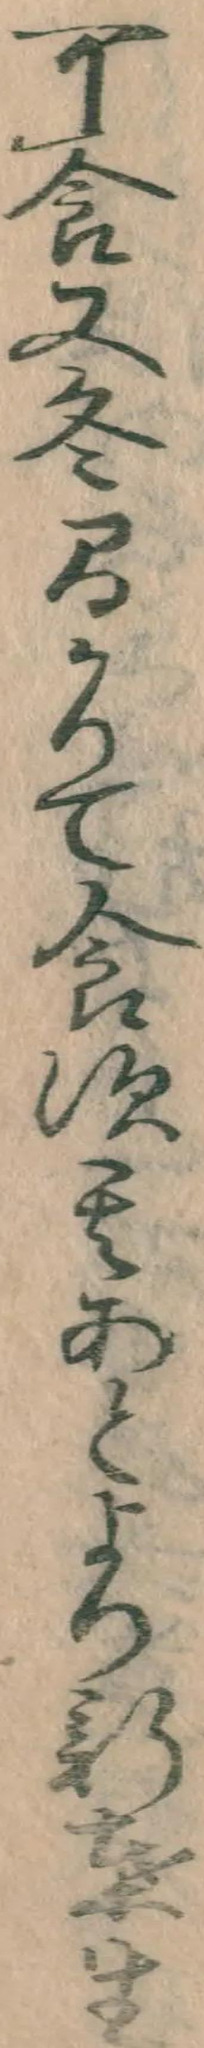可食又冬間かりて食す其あとより新葉生
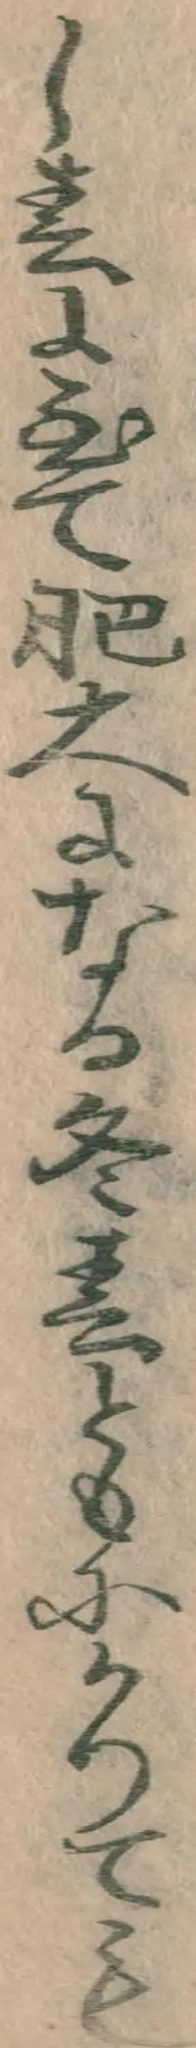し春に至て肥大になる冬春ともにかりても
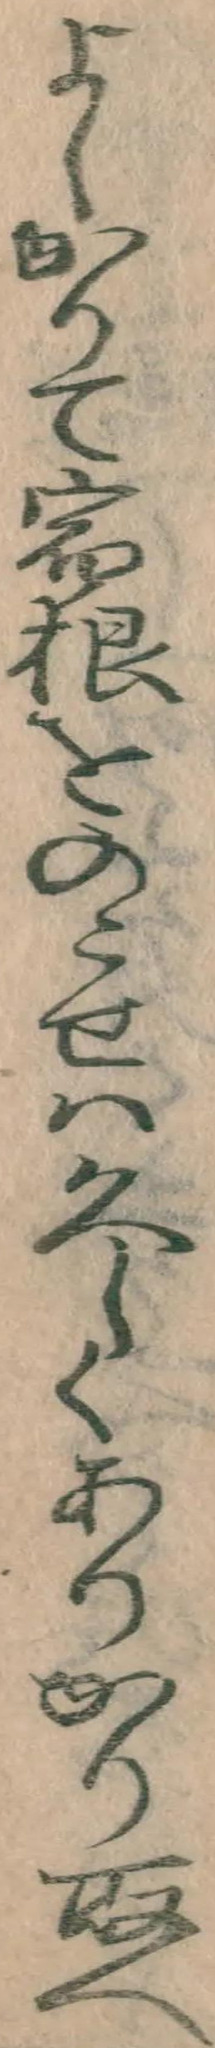よしかりて宿根をのこせは久しくありかり取へ
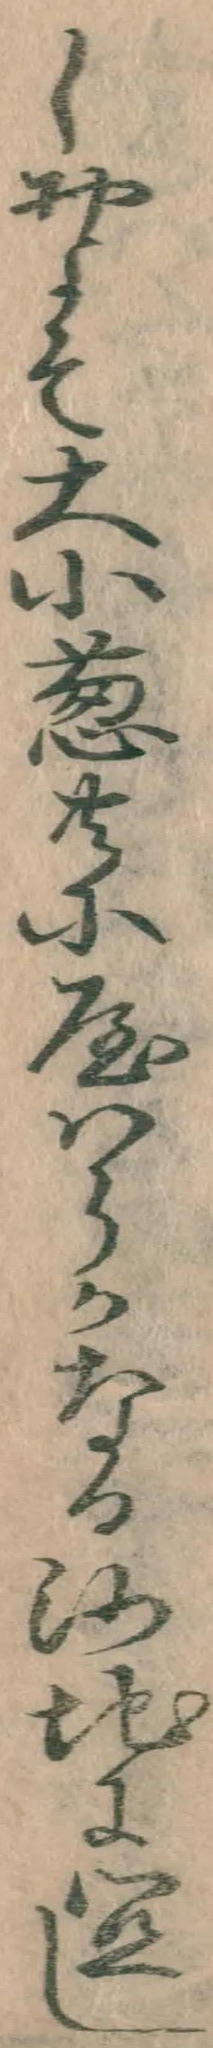しおよそ大小葱共にやはらかなる沙地に宜し
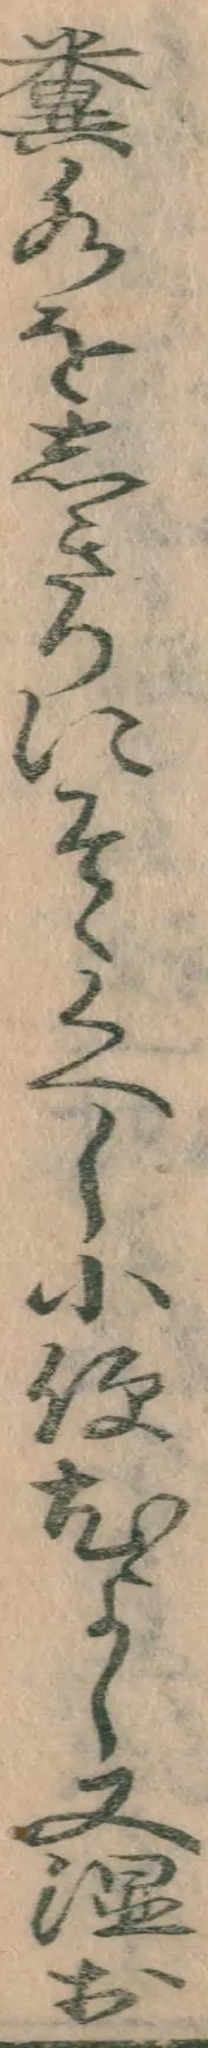糞水をしきりにそゝくへし小便尤よし又湿お
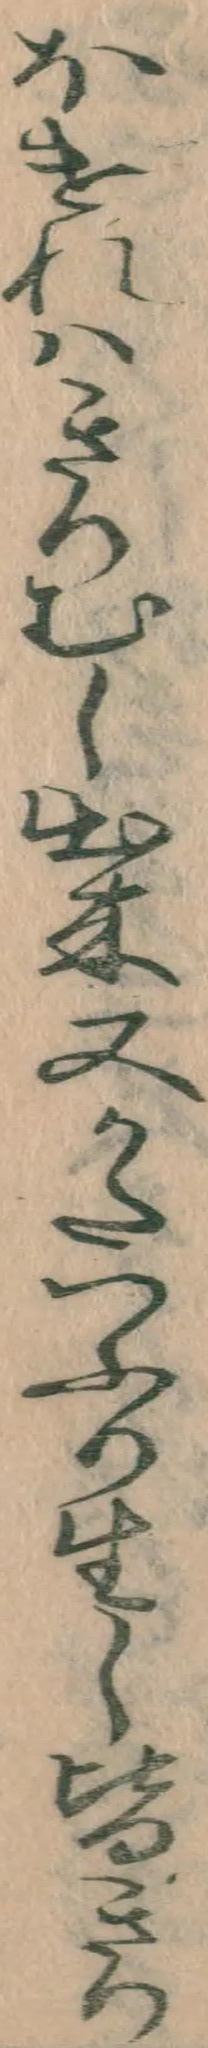ほけれはきりむし出来又かたつふり生し皆きり
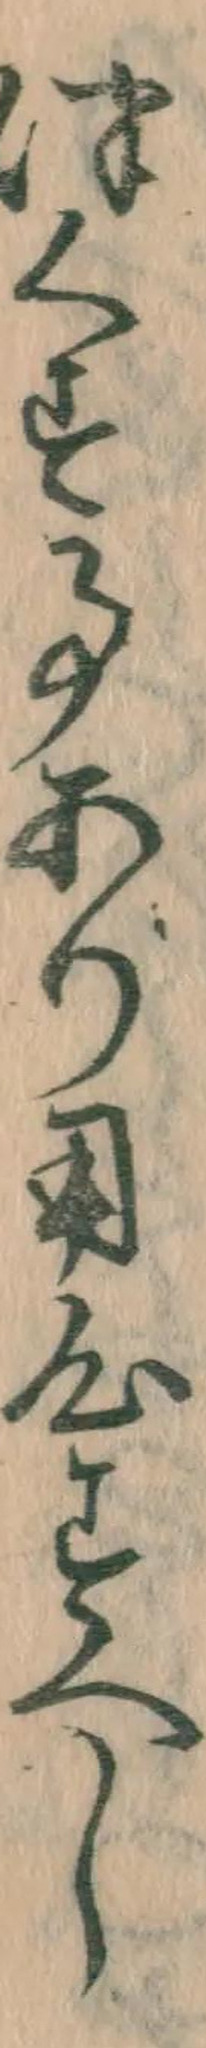つくす事あり用心すへし
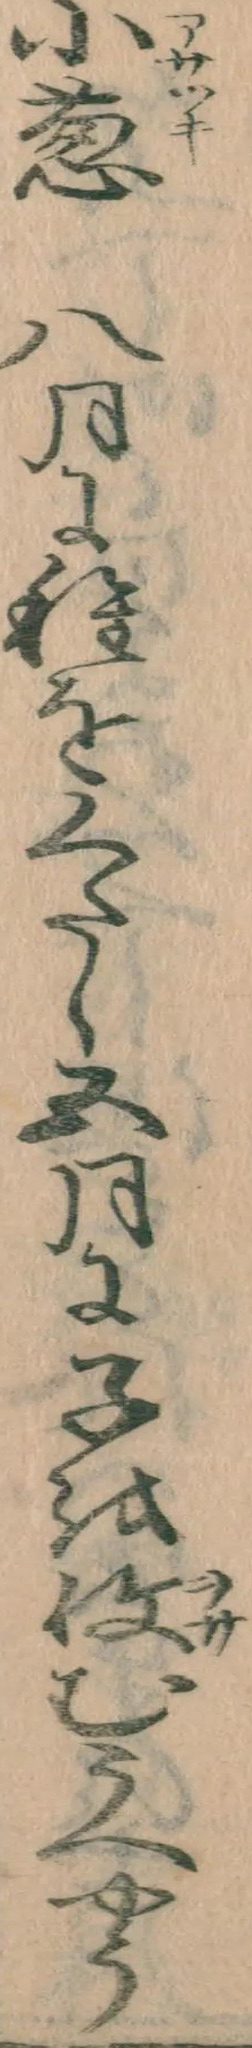小葱八月に種をくたし五月に子を収むうへやう
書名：菜譜 3巻
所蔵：国立国会図書館 National Diet Library, JAPAN
